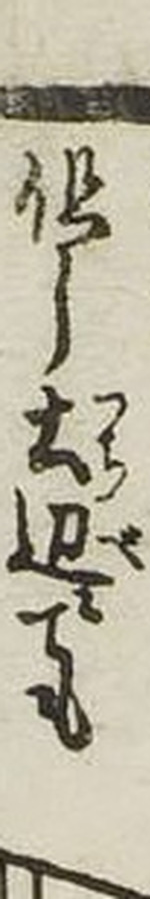但し土辺にても
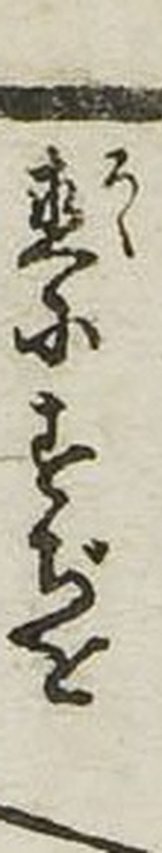直にすぢを
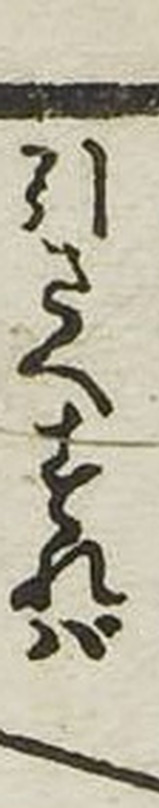引さへすれば
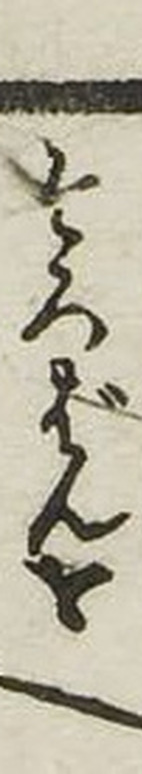そろばんを
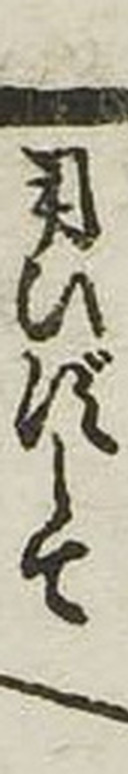用ひずして
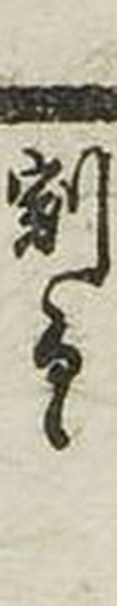割るゝ
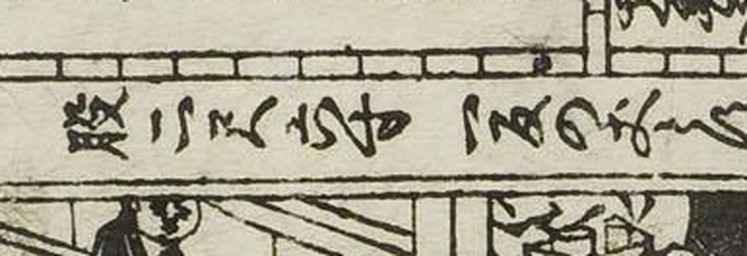股二尺六寸一反の丈とす
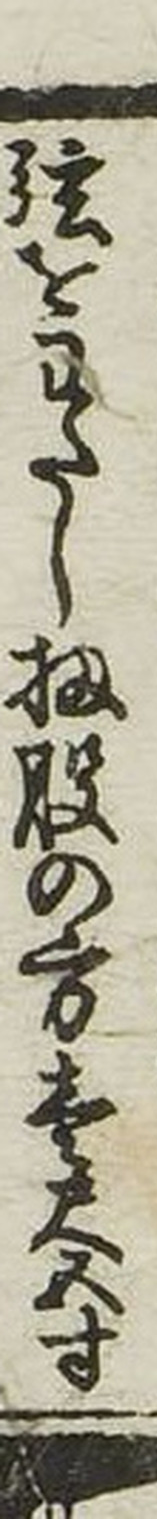弦をわたし扨股の方壱尺五寸
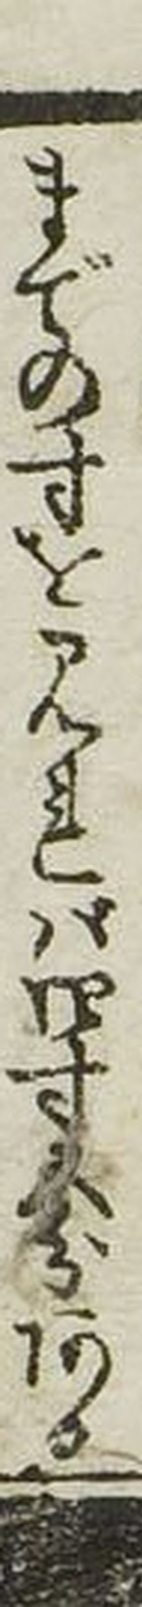までの寸を見れば四寸五分ある
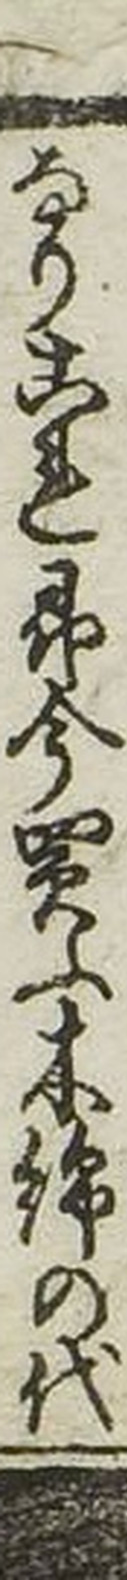なりこれ即今買ふ木綿の代
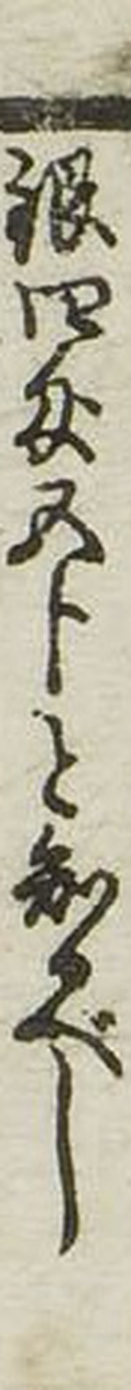銀四匁五分と知るべし
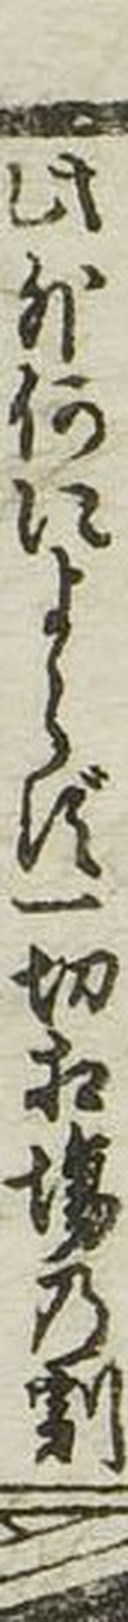此外何によらず一切相場の割
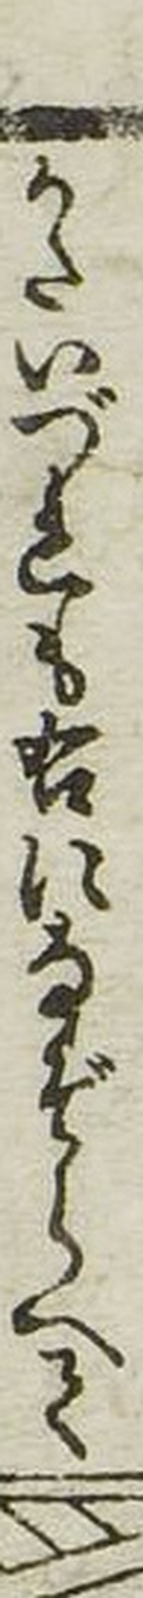かたいづれも右になぞらへて
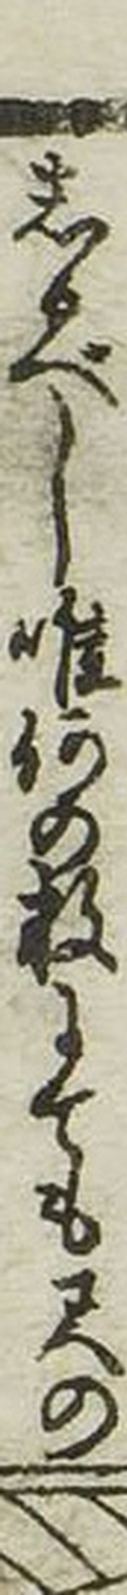しるべし唯何の数にても尺の
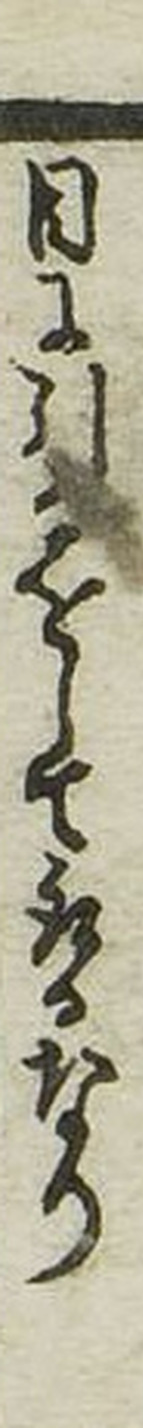目に引をして取るなり

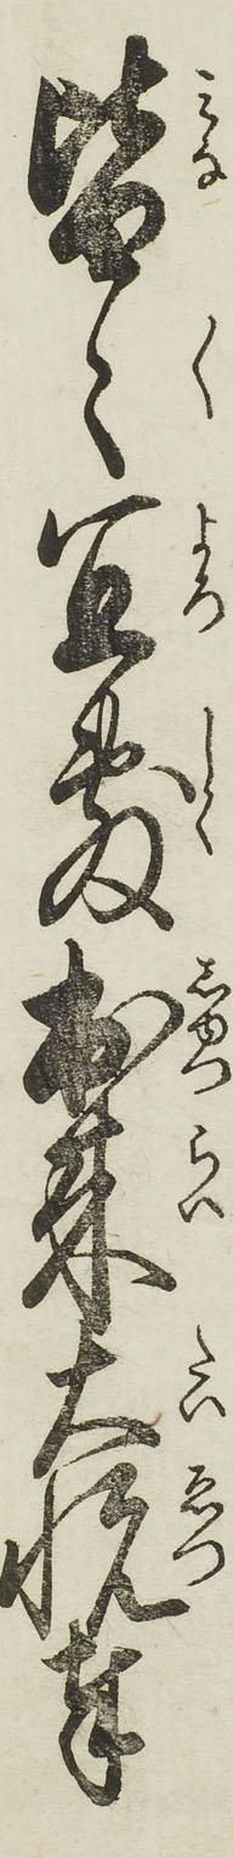皆々宜敷出来大悦奉
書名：商人書翰便覧
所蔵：東京学芸大学教育コンテンツアーカイブ
